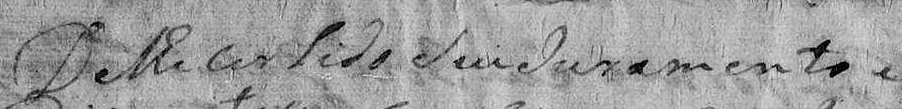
De lhe cer lido seu Iuramento, e
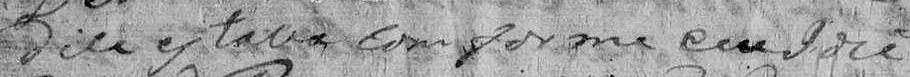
dice estava comforme e eu Iozé
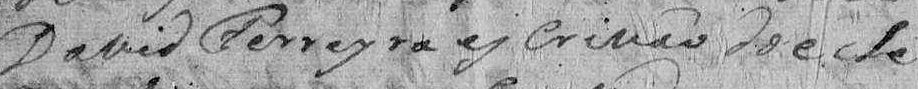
David Ferreyra escrivaõ do ecle
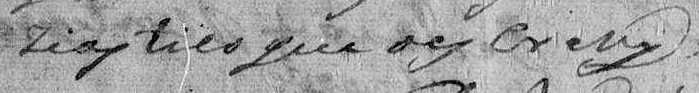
ziastico que o escreuy
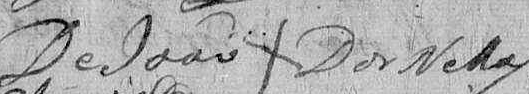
De Ioaõ + DorNellas
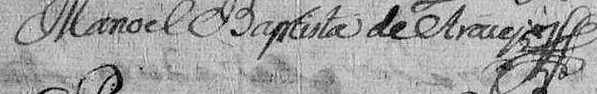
Manoel Baptista de Araujo
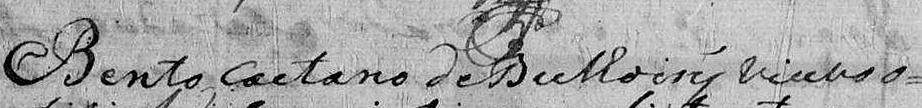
Bento caetano de Bulhoin̄s viuvo o
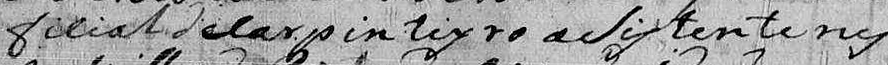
ficial de carpinteyro aSistente nes
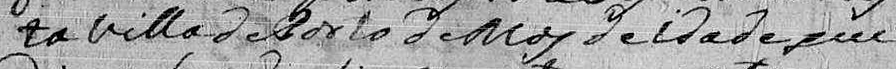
ta villa de Porto de Mos de idade que
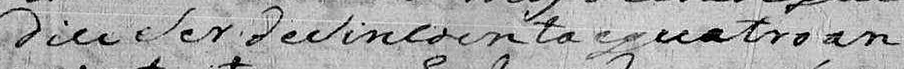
dice ser de sincoenta e quatro an
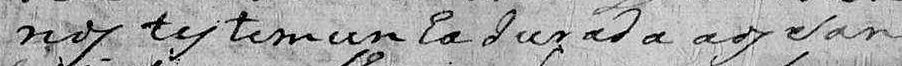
nos testemunha Iurada aos San
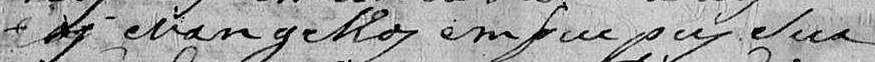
tos evangelhos em que pus sua
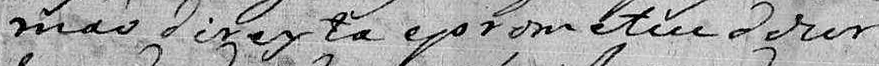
maõ direyta e prometeu dizer
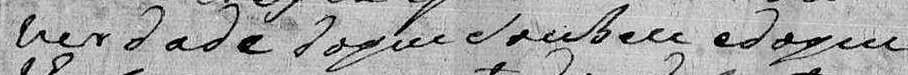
verdade do que soubece e do que
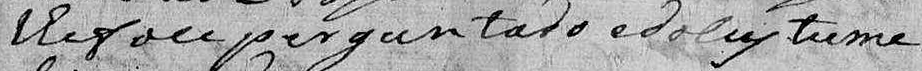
lhe foce perguntado e do custume
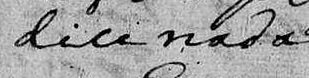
dice nada
